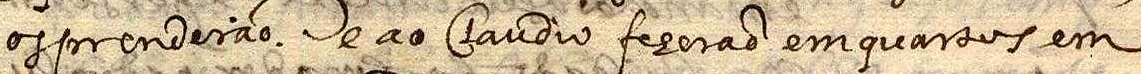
os prenderaõ. e ao Claudio fezeraõ em quartos em
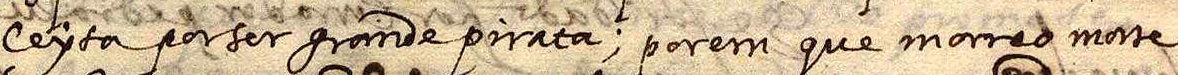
Ceyta por ser grande pirata; porem que morreo morte
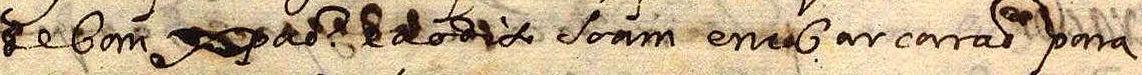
de bom Xpaõ. e ao dito Ioam embarcaraõ para
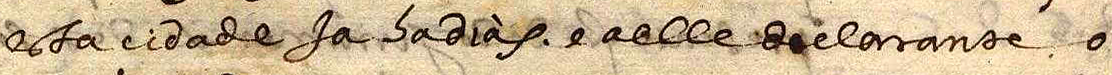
esta cidade Ja ha dia. e a elle declarante o
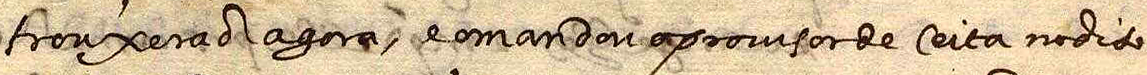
trouxeraõ agora, e o mandou a prouisor de Ceita no dito
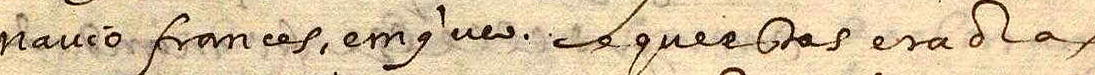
nauio frances, em q̄ ueo. e que estas eraõ as
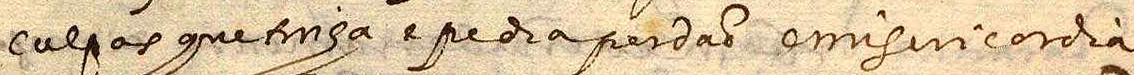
culpas que tinha e pedia perdaõ e misericordia
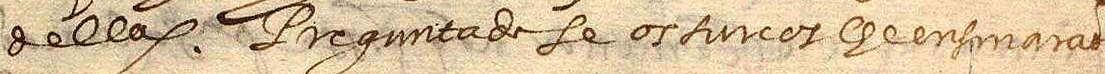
dellas. Preguntado se os turcos lhe ensinaraõ
